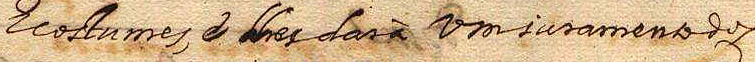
E costumes, e lhes darà Vm iuramento dos
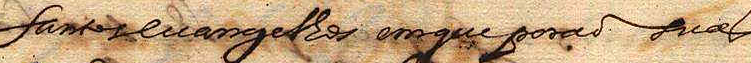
santos euangelhos em que poraõ suas
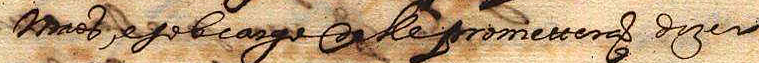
maõs, e sob cargo delle prometteraõ dizer
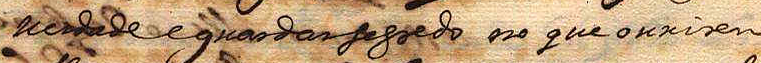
uerdade e guardar segredo no que ouuiren
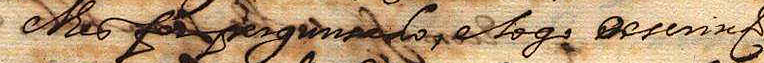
e lhes for perguntado, e logo o escriuaõ
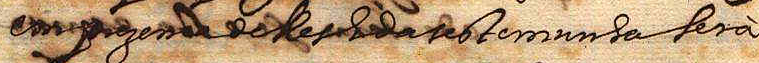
em prezença delles E da testemunha lerà
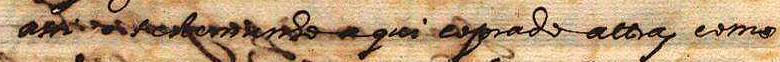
assi o testemunho aqui copiado attras como
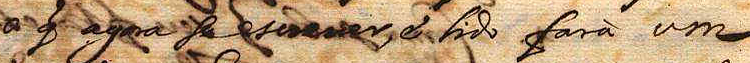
o q̄ agora se escreuer, e lido farà vm
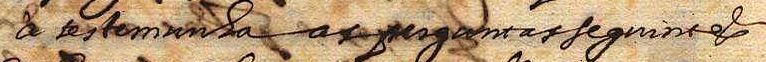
à testemunha as perguntas seguintes
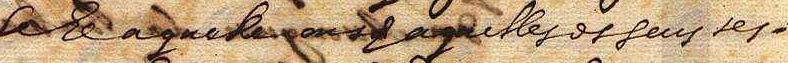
Se he aquelle ou são aquelles os seus tes
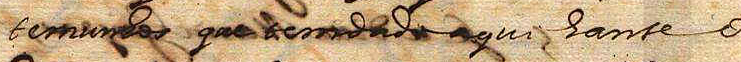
temunhos que tem dado aqui E ante o
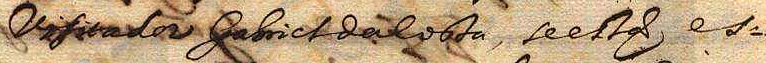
Visitador Gabriel da Costa, se estaõ es
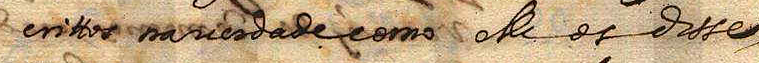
crittos na uerdade como elle os disse,
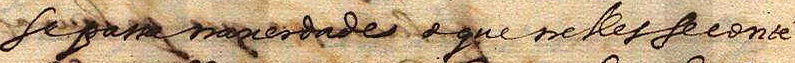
se passa na uerdade o que nelles se contē
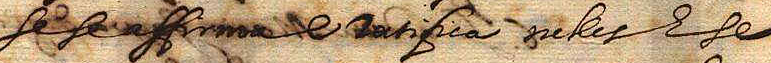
se se affirma e ratifica nelles E se
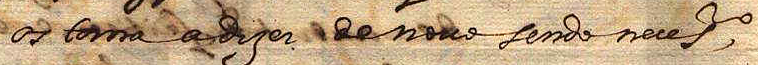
os torna a dizer de nouo sendo necesro,
